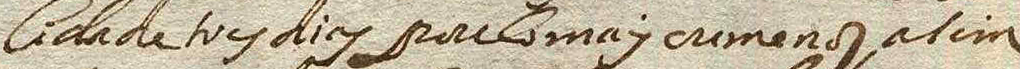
Cidade tres dias pouCo mais ou menos, asim
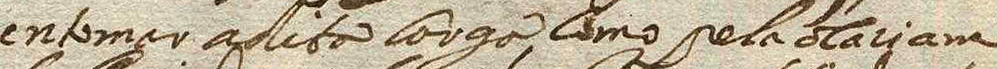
en tomar a dita Carga, como pela oCaziam
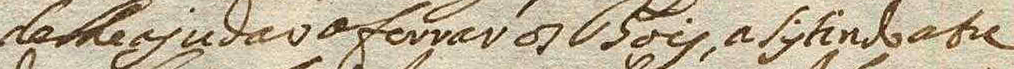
de lhe ajudar o ferrar os Bois, asistindo a tu
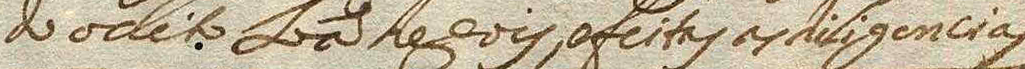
do o dito Joã de gois, e feitas as diligencias
